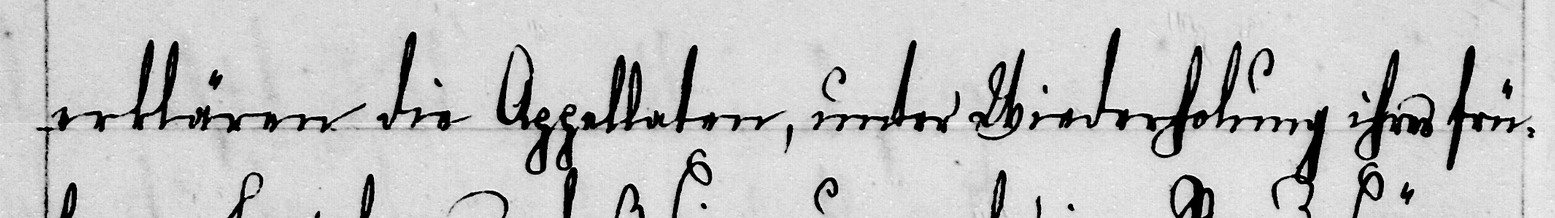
erklären die Appellaten, unter Wiederholung ihres frü¬
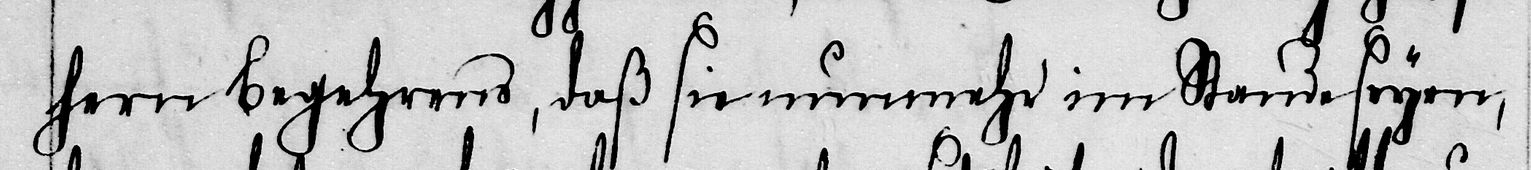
hern Begehrens, daß sie nunmehr im Stande seyen,
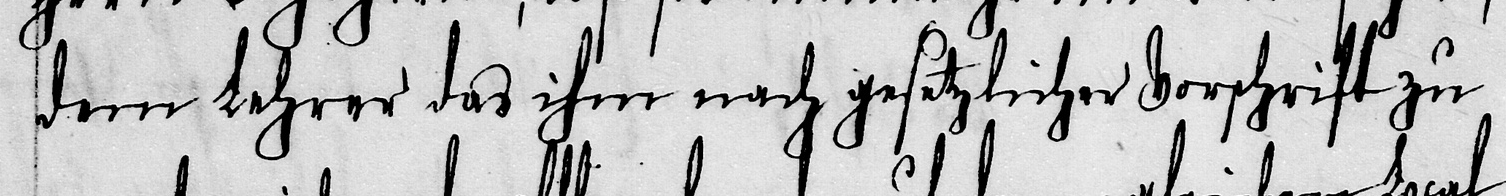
dem Lehrer das ihm nach gesetzlicher Vorschrift zu
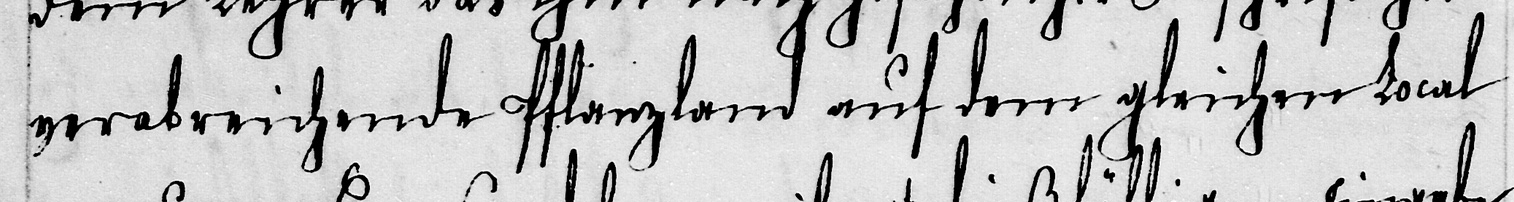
verabreichende Pflanzland auf dem gleichen Local
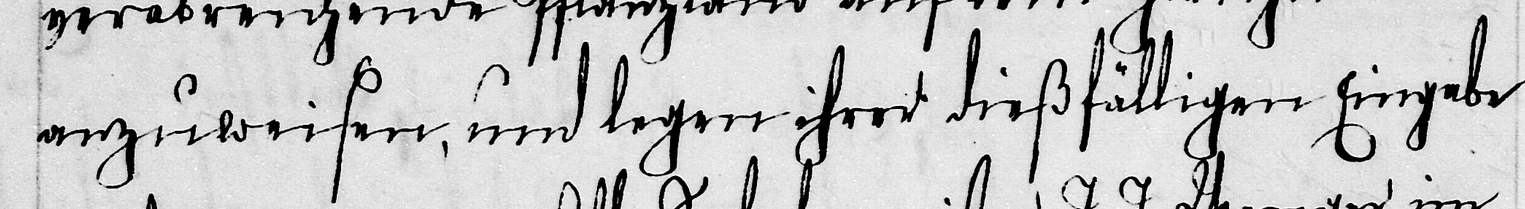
anzuweisen, und legen ihrer dießfälligen Eingabe
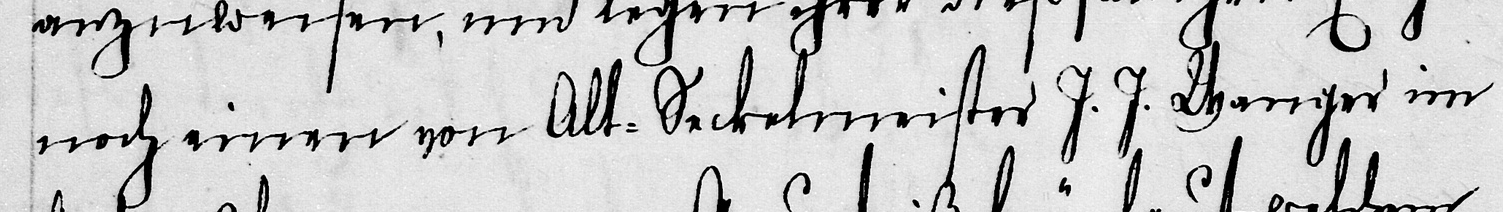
noch einen von Alt-Seckelmeister J. J. Wanger im
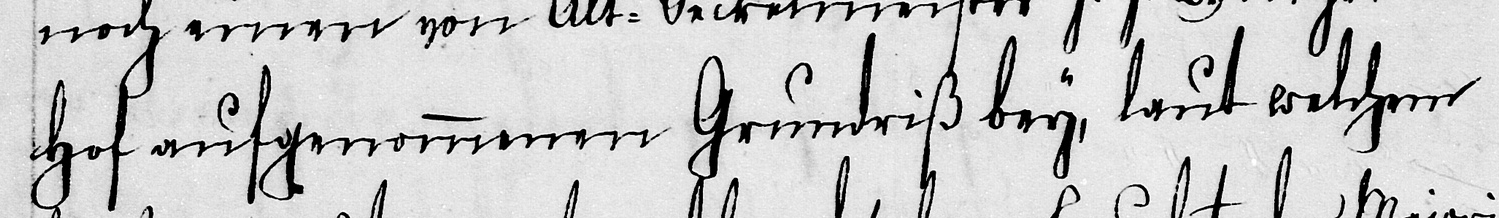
Hof aufgenommenen Grundriß bey, laut welchem
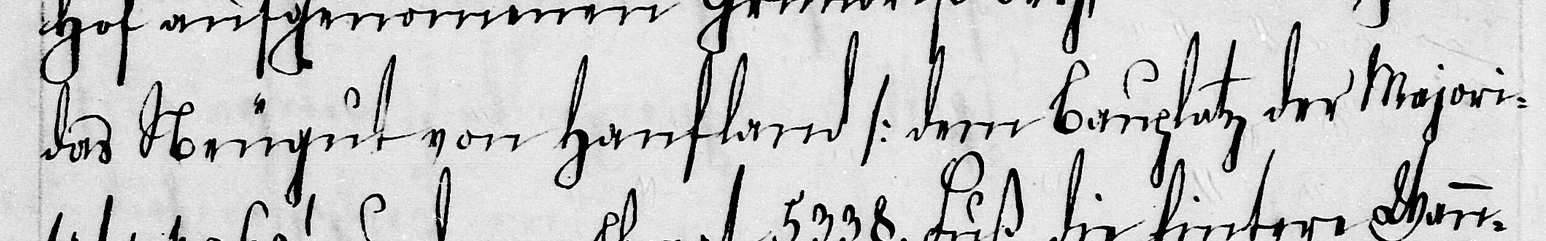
das Neugut von Hanfland [dem Bauplatz der Majori¬
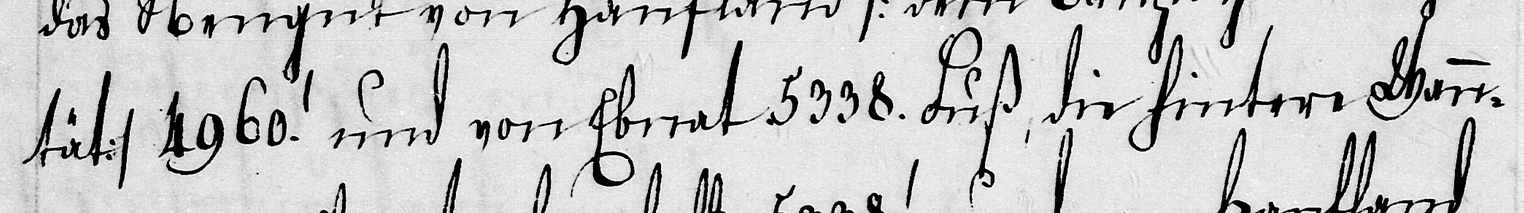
tät] 4960.‘ und von Ebnat 5338. Fuß, die hintere Wann¬
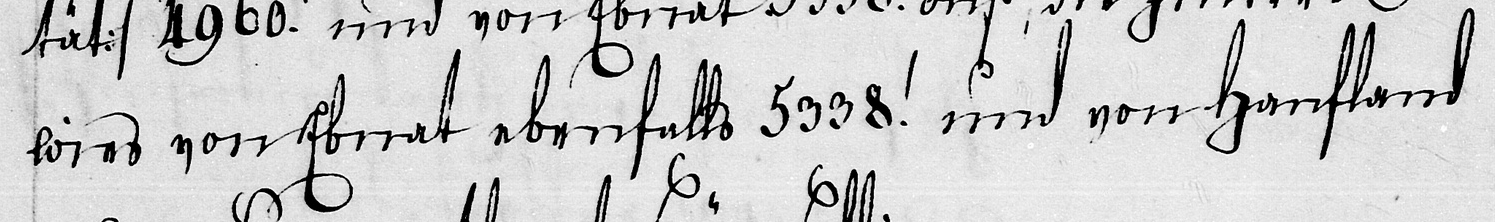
wies von Ebnat ebenfalls 5338.‘ und von Hanfland
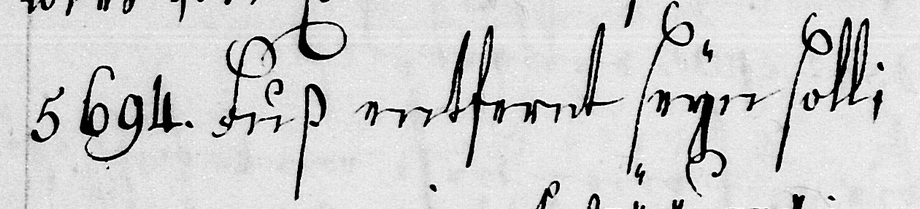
5694. Fuß entfernt seyn soll;
